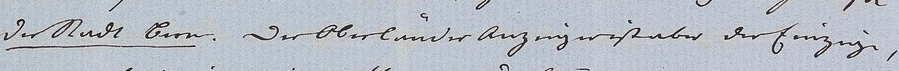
der Stadt Bern. Der Oberländer Anzeiger ist aber der Einzige,
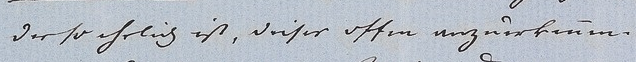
der so ehrlich ist, dieses offen anzuerkennen. –
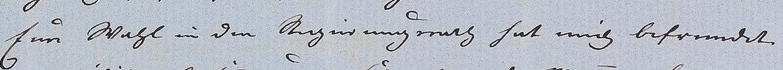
Eure Wahl in den Regierungsrath hat mich befremdet.
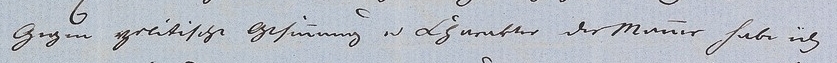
Gegen politische Gesinnung u Charakter des Mannes habe ich
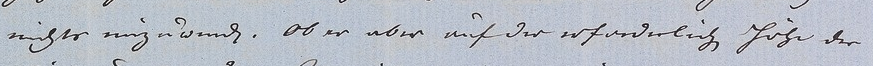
nichts einzuwenden. Ob er aber auf der erforderlichen Höhe der
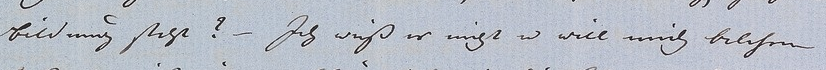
Bildung steht? – Ich weiß es nicht u will mich belehren
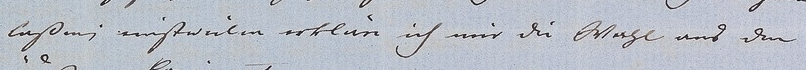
lassen; einstweilen erkläre ich mir die Wahl aus den
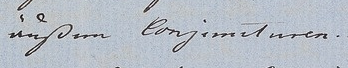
äußern Conjuncturen. –
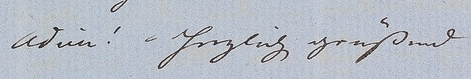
Adieu! Herzlich grüßend
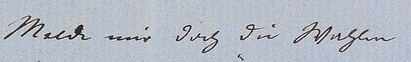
Melde mir doch die Wahlen
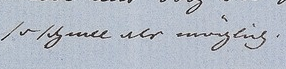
so schnell als möglich.
